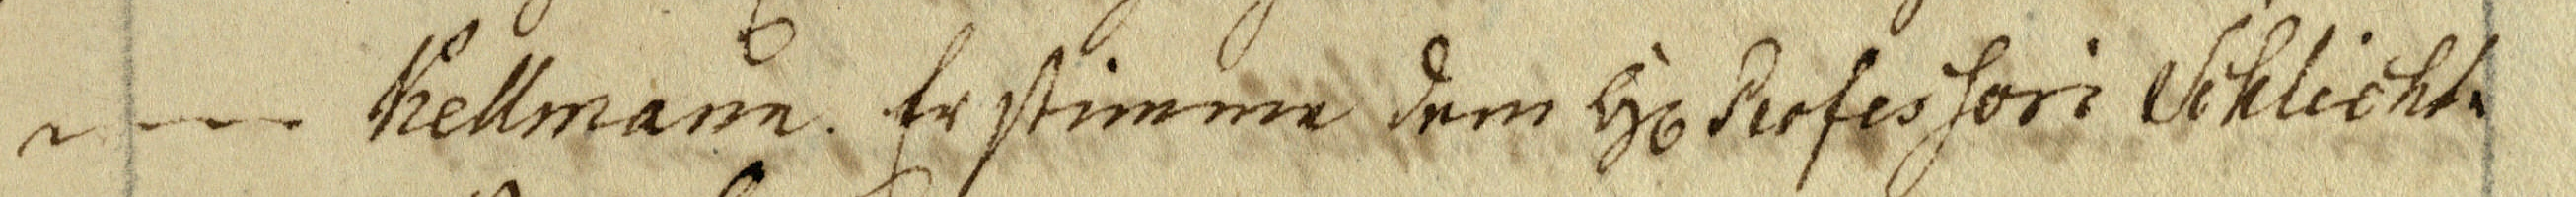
Kellmann. Er stimme dem H Professori Schlicht¬
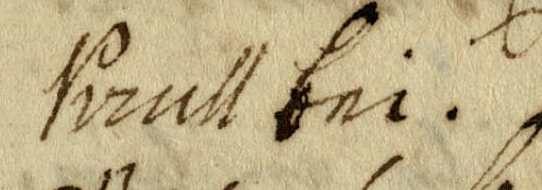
krull bei.
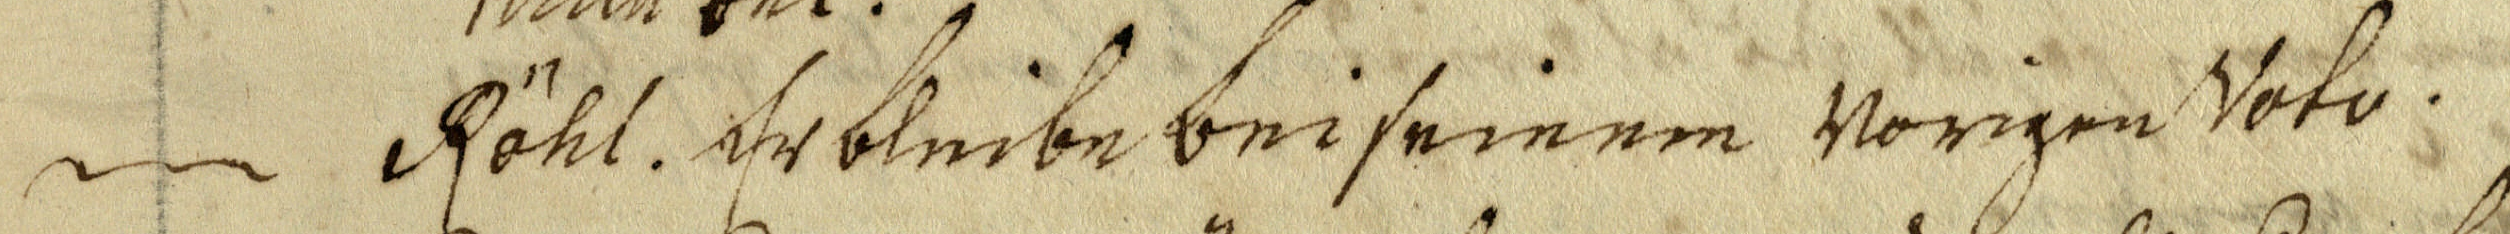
Röhl. Er bleibe bei seinem vorigen Voto.
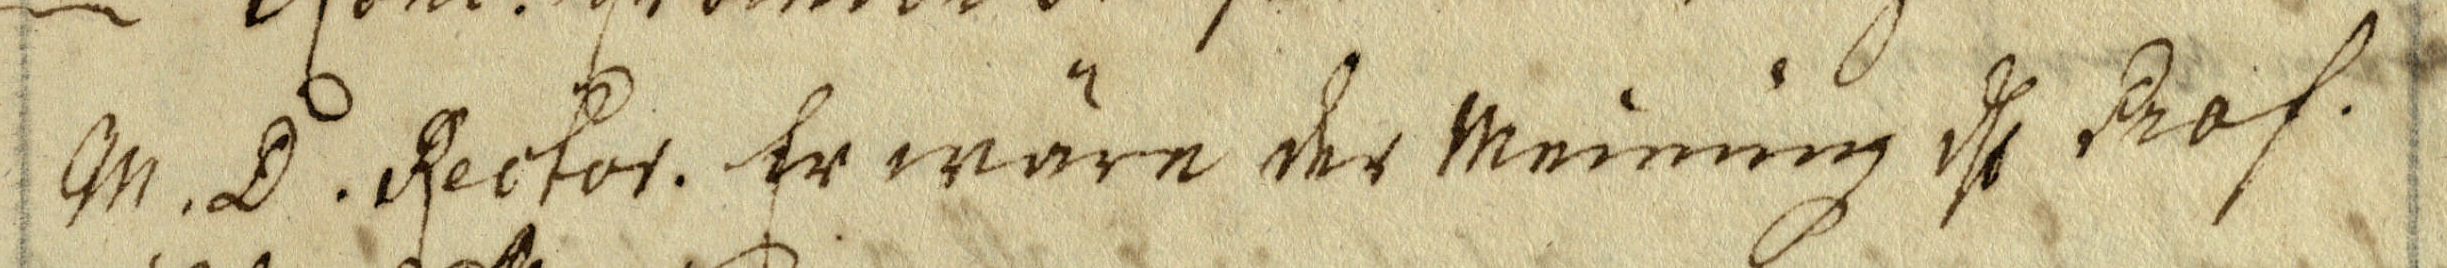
M. D. Recor. Er wäre der Meinung dh Prof.
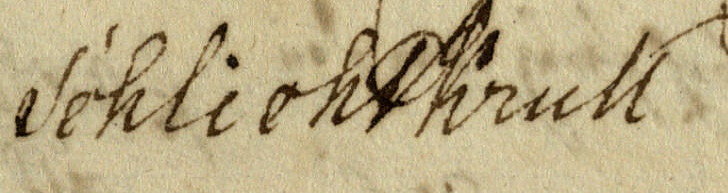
Schlichtkrull.
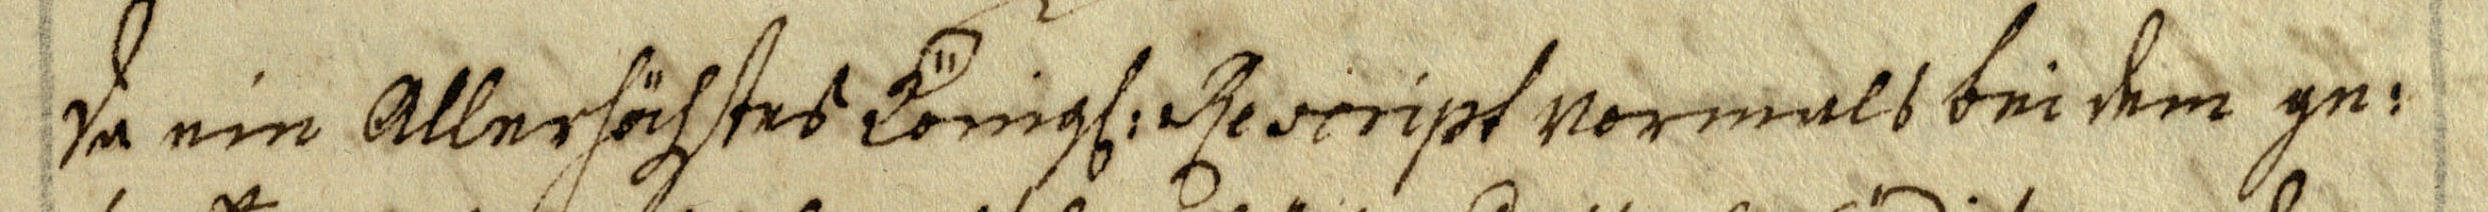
Da ein Allerhöchstes Königl. Rescript vormals bei dem ge¬
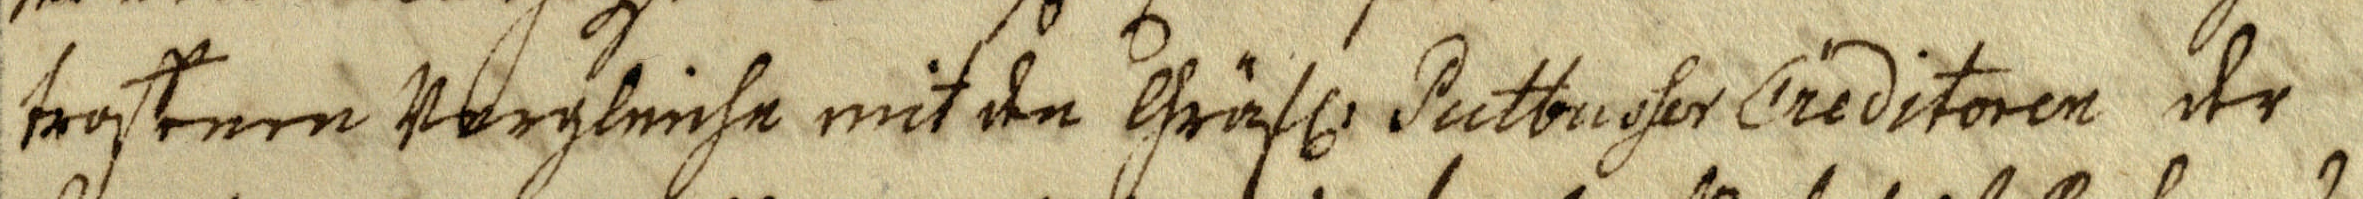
troffenen Vergleiche mit den Gräfl. Putbusser Creditoren der
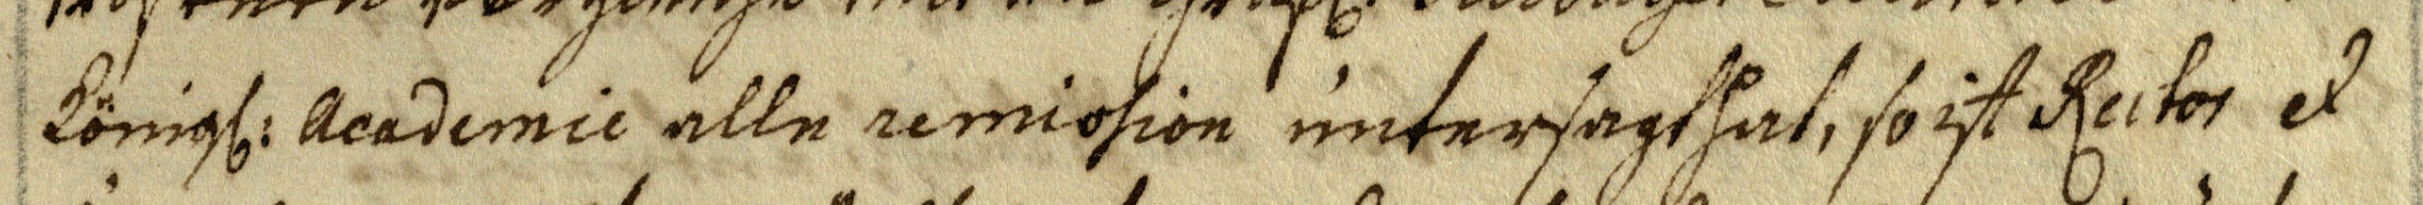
Königl. Academie alle remission untersagt hat, so ist Rector et
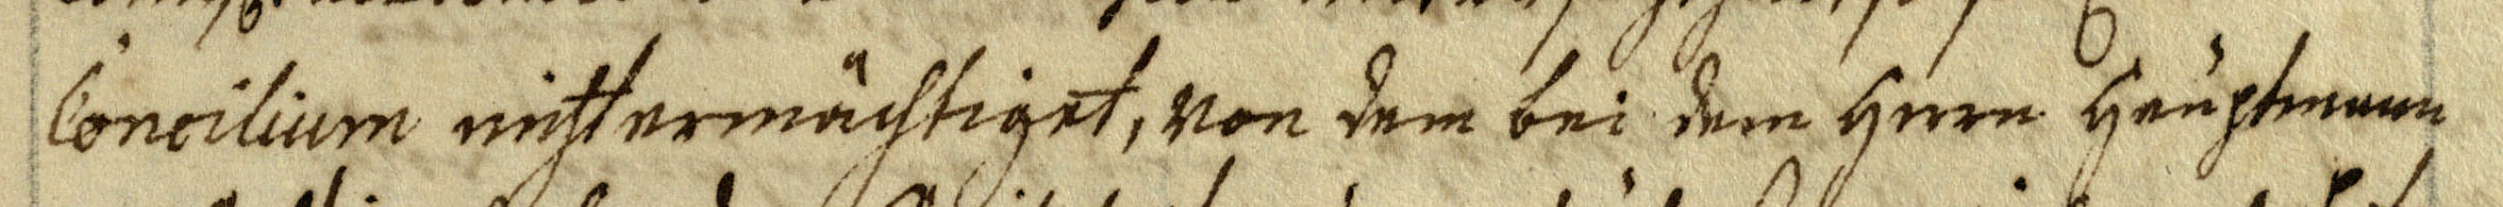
Concilium nicht ermächtiget, von dem bei dem Herrn Hauptmann
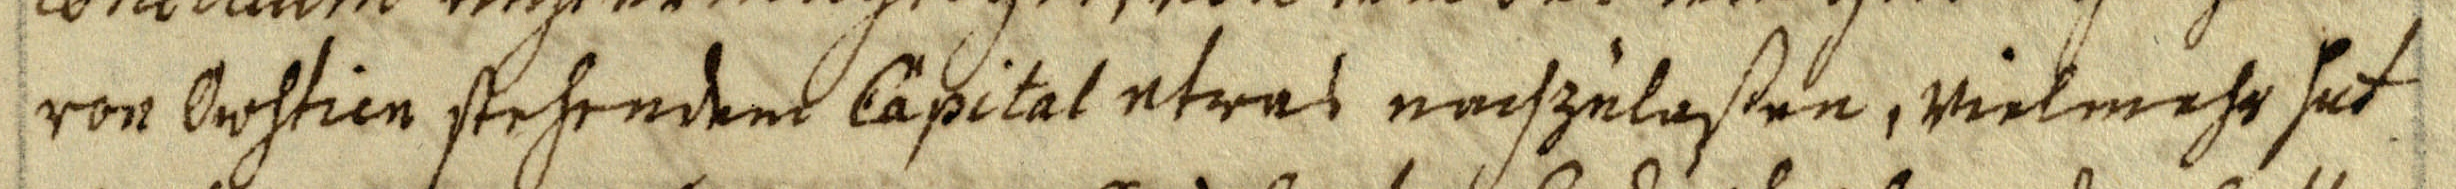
von Owstien stehendem Capital etwas nachzulaßen, vielmehr hat
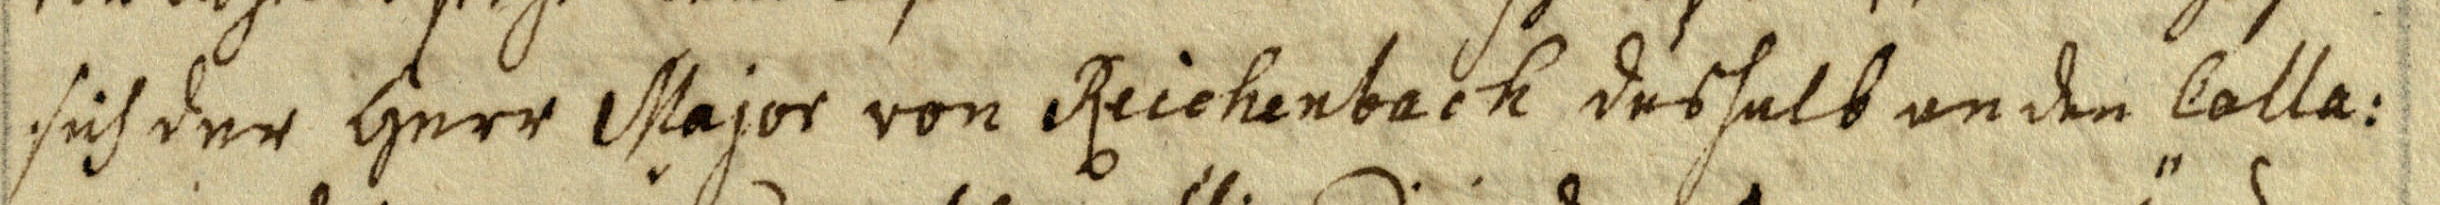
sich der Herr Major von Reihenbach deshalb an den Colla¬
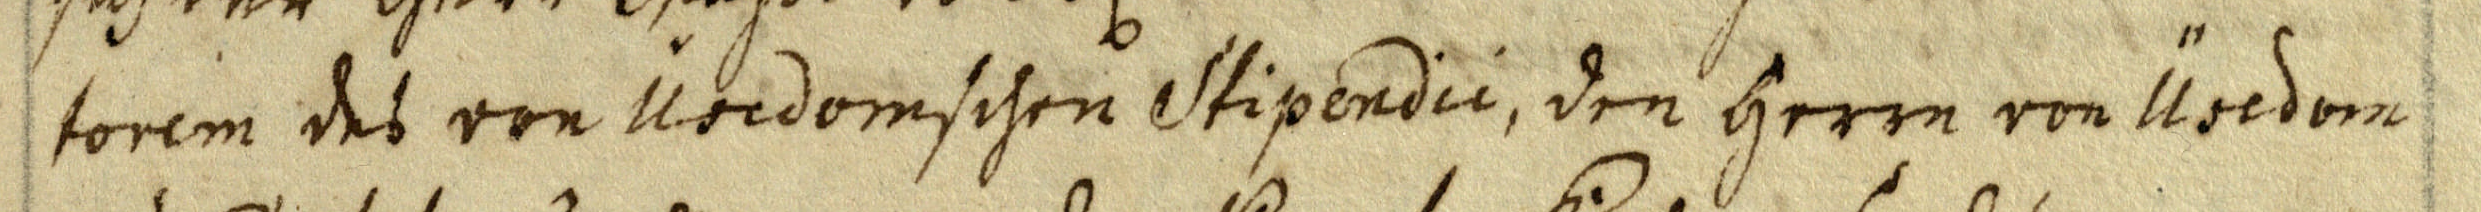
torem des von Usedomschen Stipendii, den Herrn von Usedom
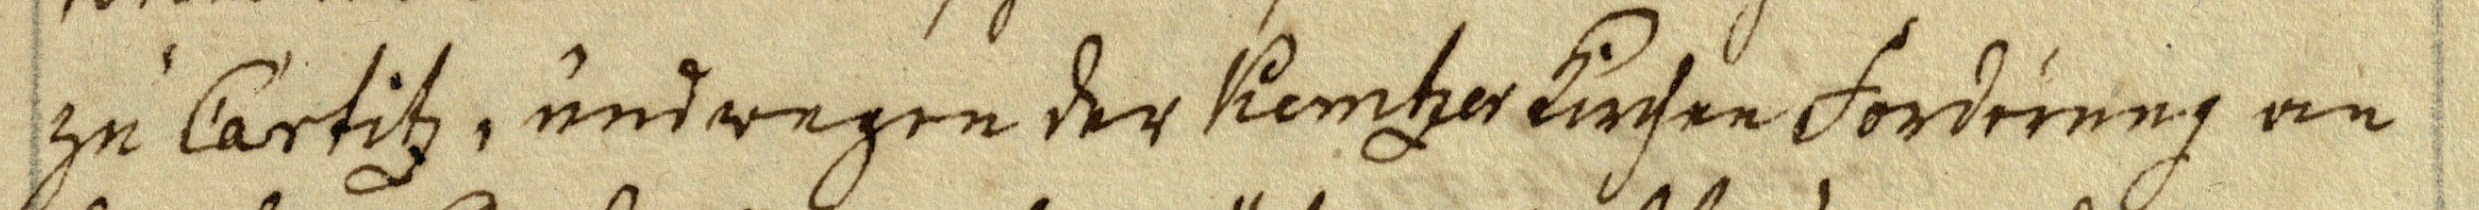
zu Cartitz, und wegen der Kemtzer Kirchen Forderung an
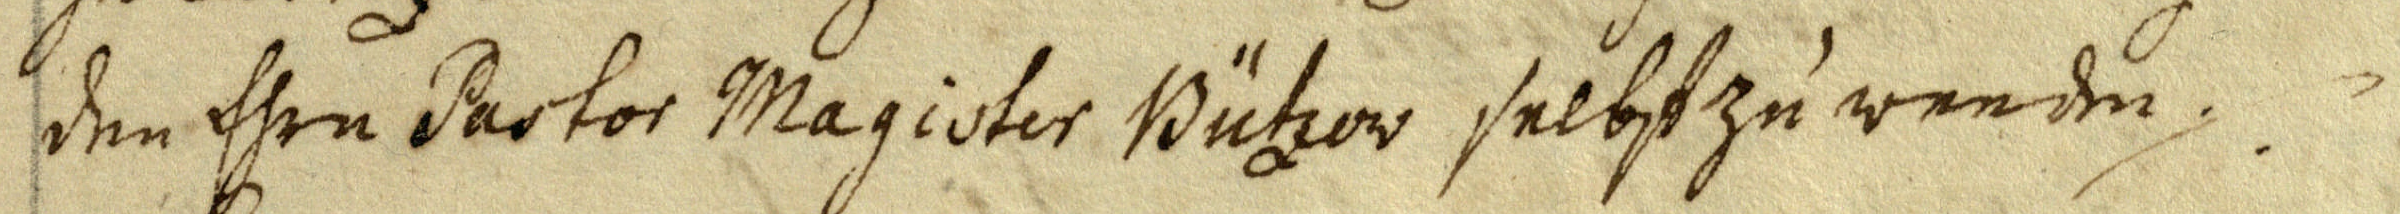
den Ehrn Pastor Magister Bützow selbst zu wenden.
